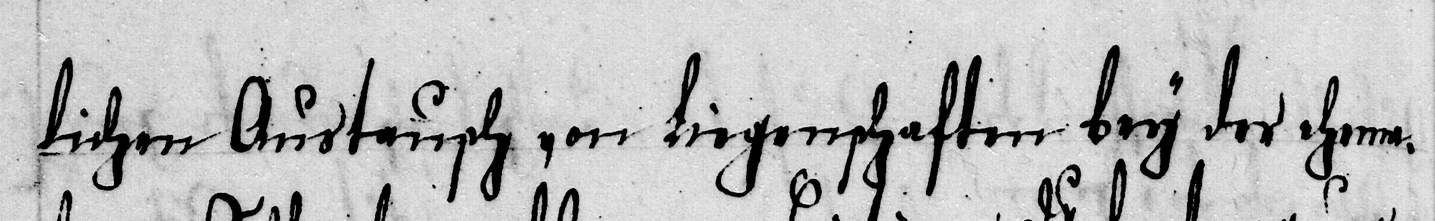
lichen Austausch von Liegenschaften bey der ehema¬
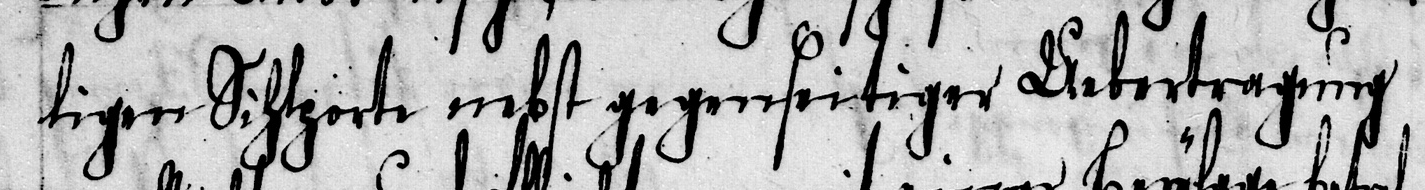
ligen Sihlporte nebst gegenseitiger Uebertragung
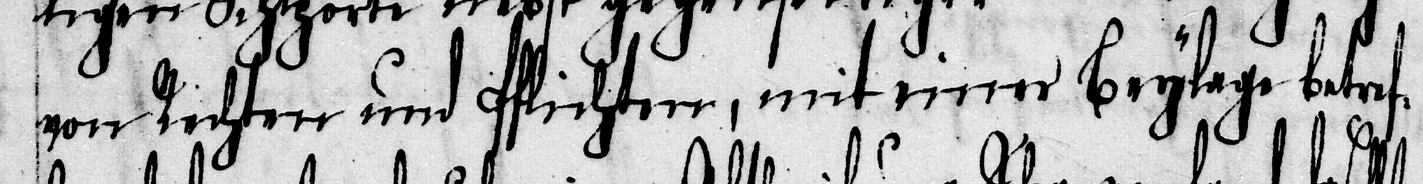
von Rechten und Pflichten, mit einer Beylage betre¬
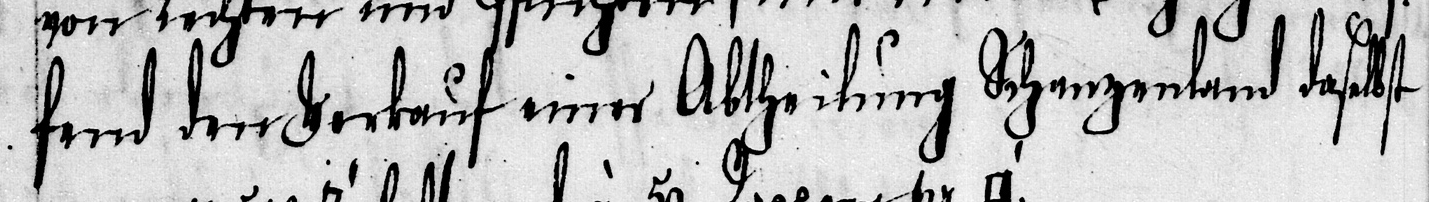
fend den Verkauf einer Abtheilung Schanzenland daselb¬
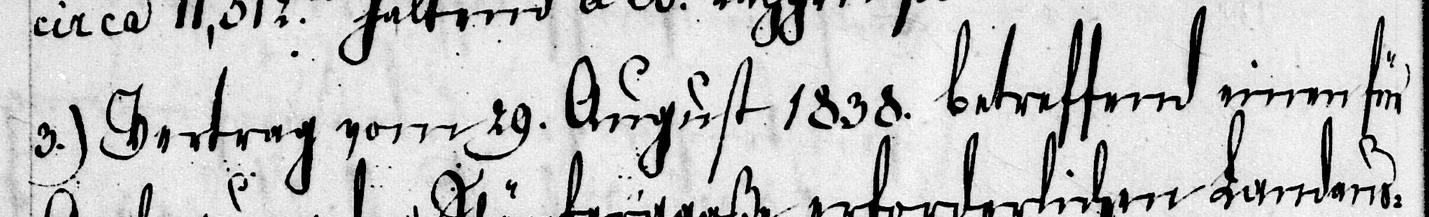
3.) Vertrag vom 29. August 1838. betreffend einen für
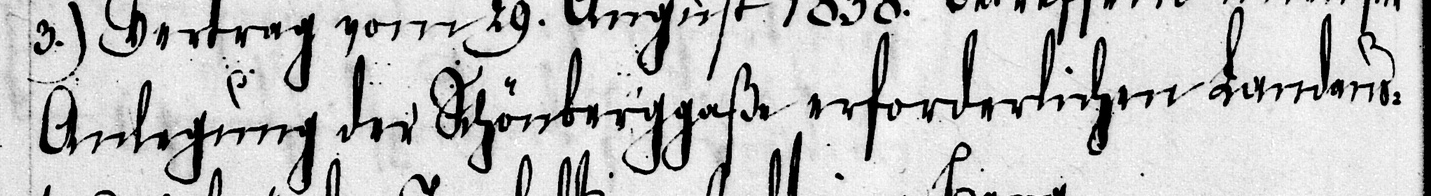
Anlegung der Schönberggaße erforderlichen Landaus¬
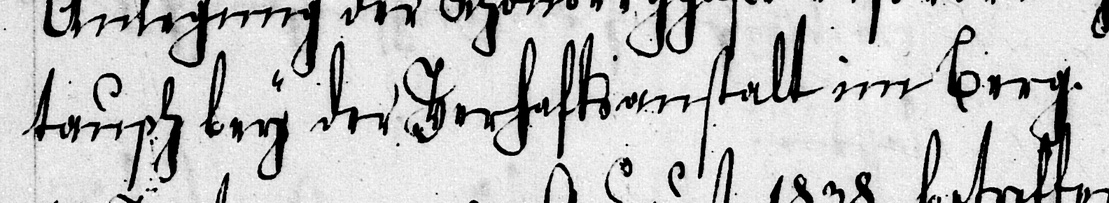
tausch bey der Verhaftsanstalt im Berg.
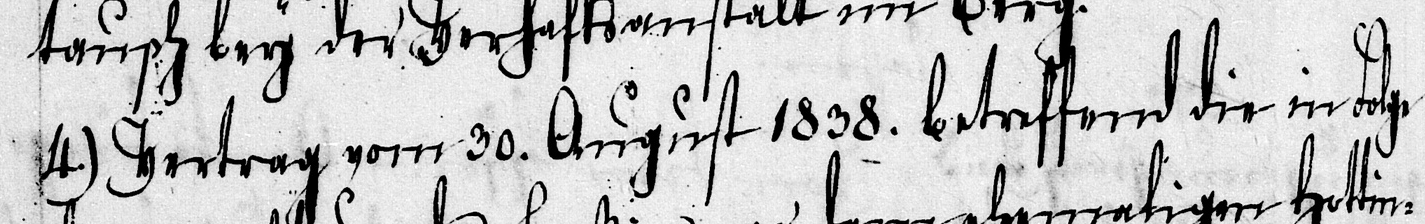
4.) Vertrag vom 30. August 1838. betreffend die in Fol¬
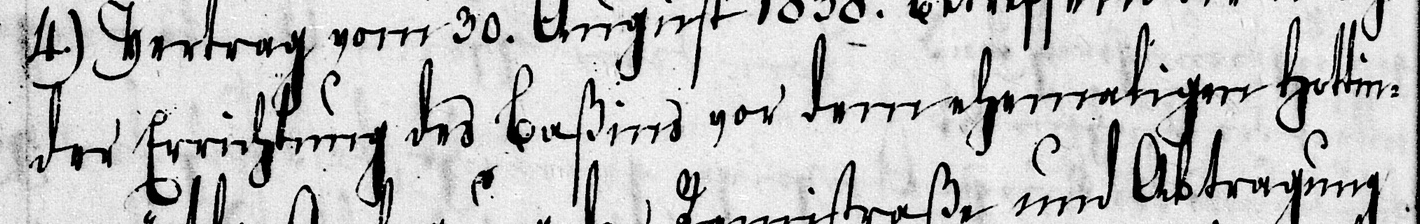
der Errichtung des Baßins vor dem ehemaligen Hotti¬
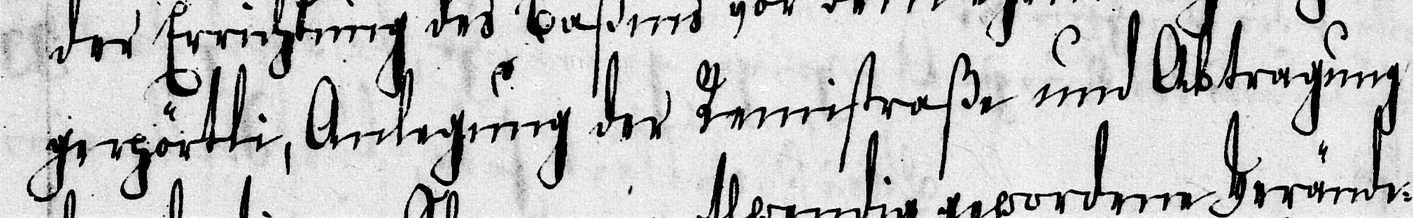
ngerpörtli, Anlegung der Remistraße und Abtragung
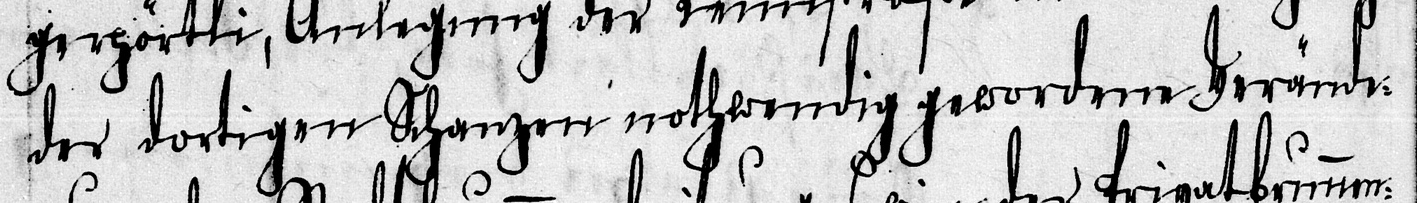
der dortigen Schanzen nothwendig gewordene Verände¬
